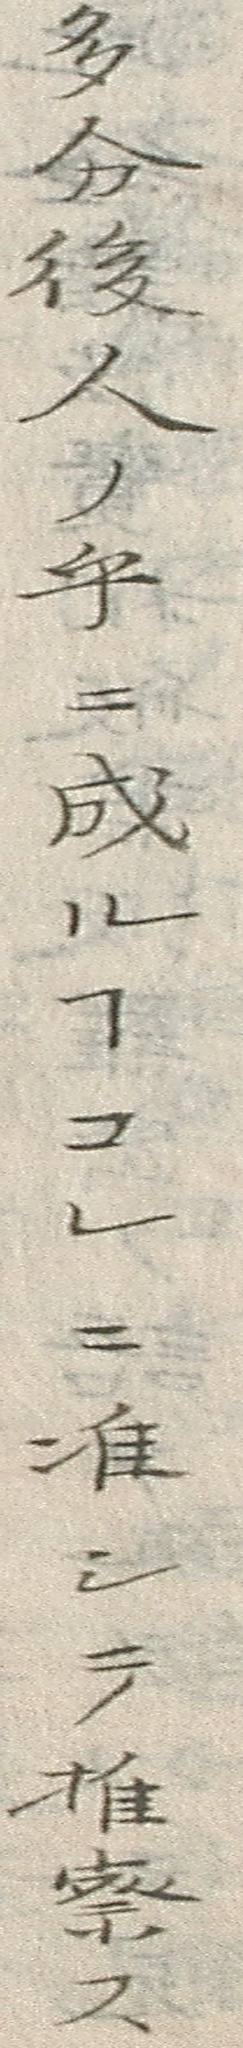多分後人ノ乎ニ成ルコトコレニ准シテ推察ス
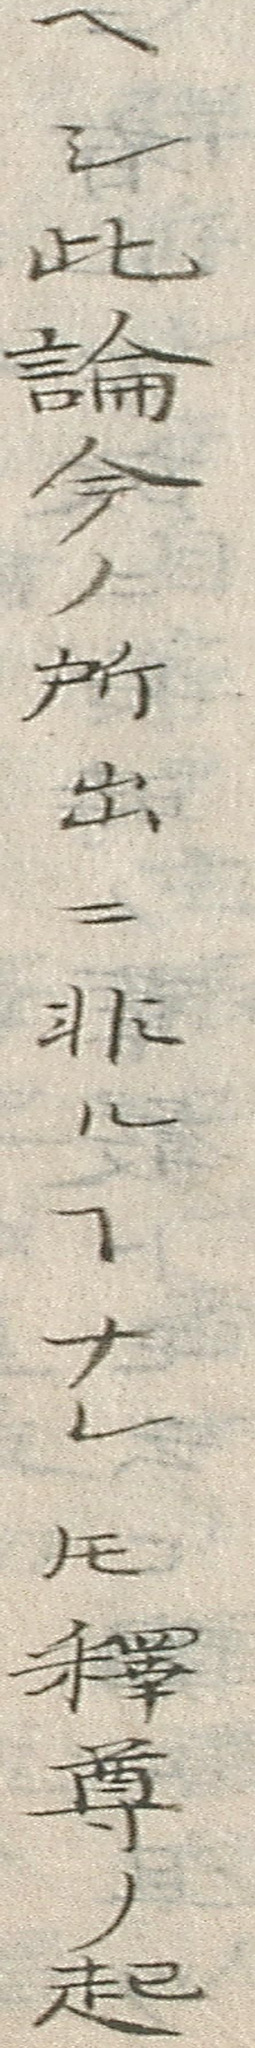ヘシ此論今ノ所出ニ非ルコトナレトモ釈尊ノ起
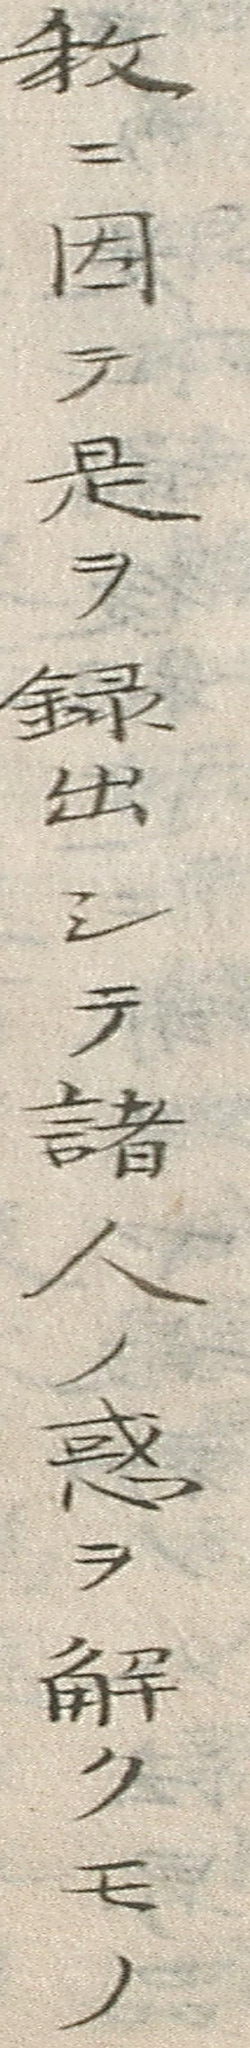牧ニ因テ是ヲ録出シテ諸人ノ惑ヲ解クモノ
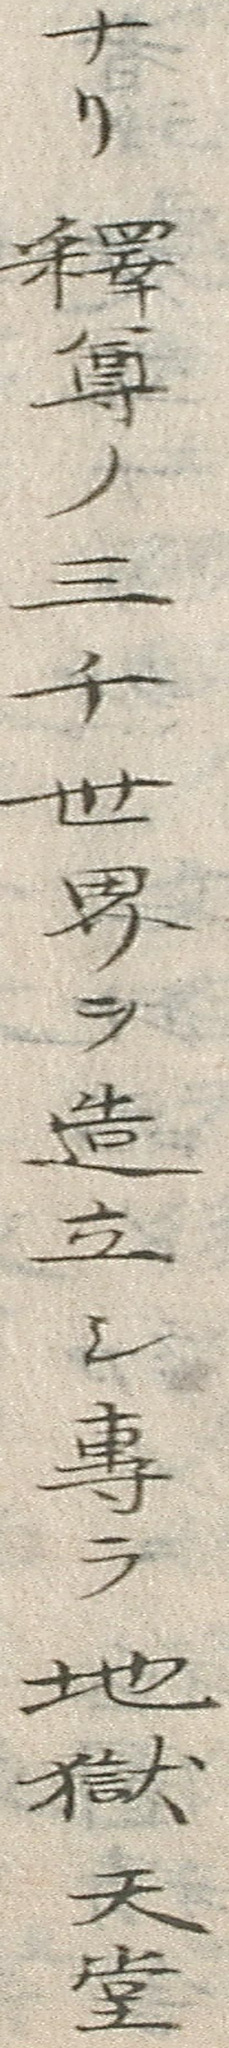ナリ釈尊ノ三千世界ヲ造立シ専ラ地獄天堂
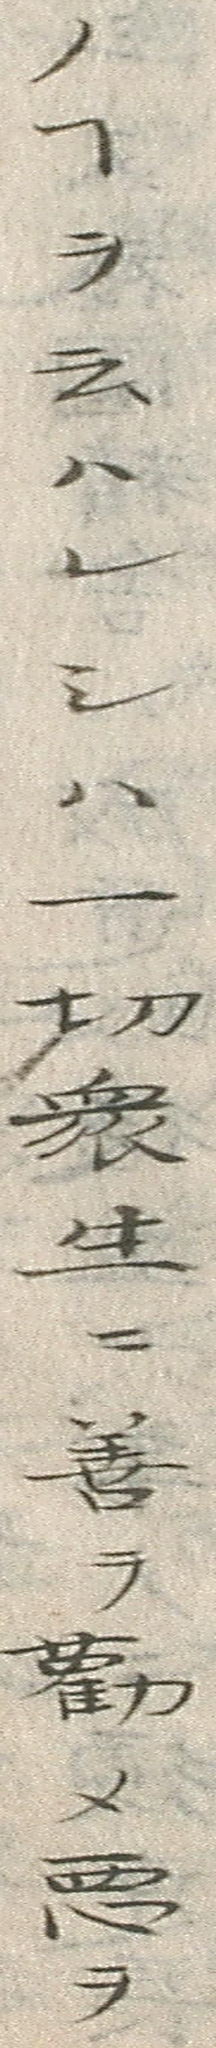ノコトヲ云ハレシハ一切衆生ニ善ヲ勤メ悪ヲ
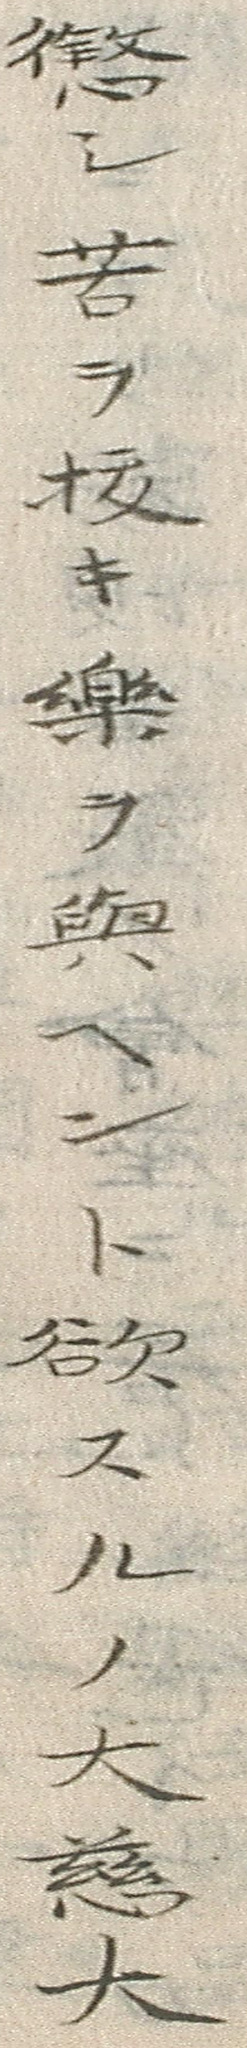懲シ苦ヲ抜キ楽ヲ与ヘント欲スルノ大慈大
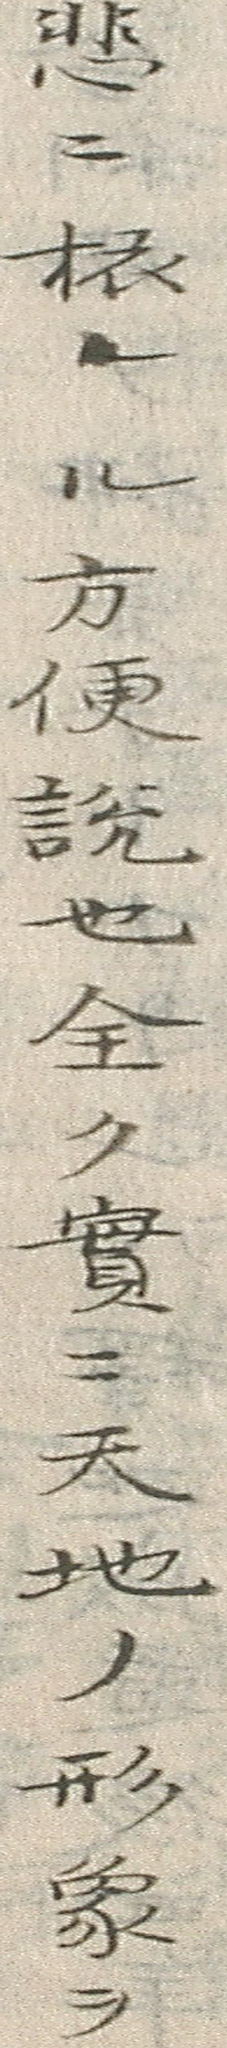悲ニ依レル方便説也全ク実ニ天地ノ形象ヲ
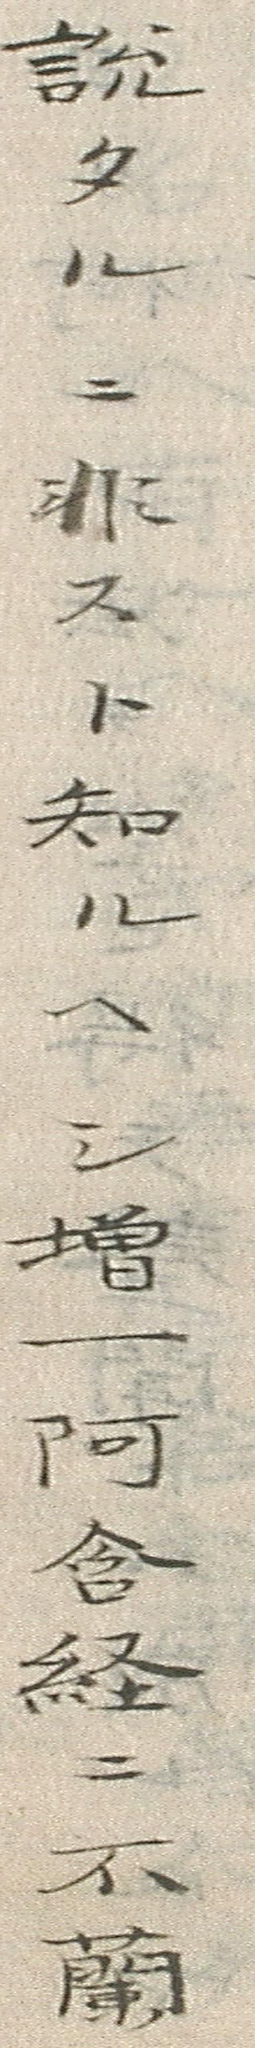説タルニ非スト知ルヘシ増一阿含経ニ不蘭
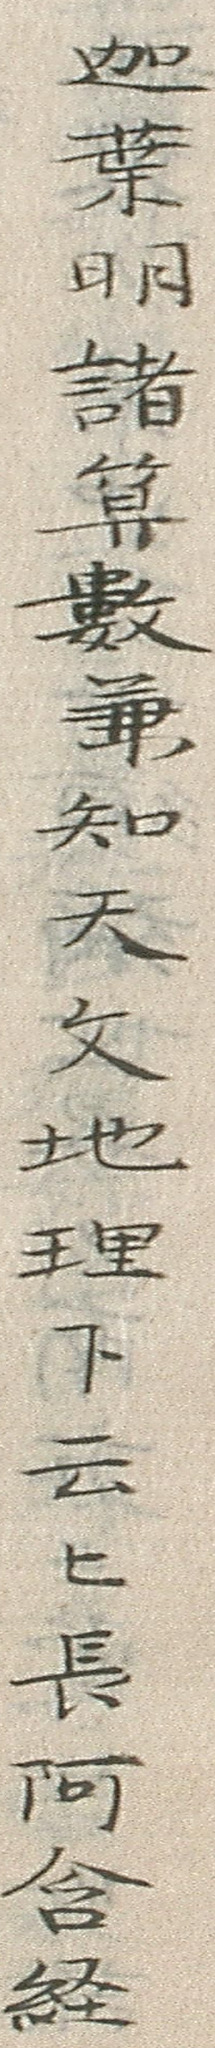迦葉明諸算数兼知天文地理ト云ヒ長阿含経
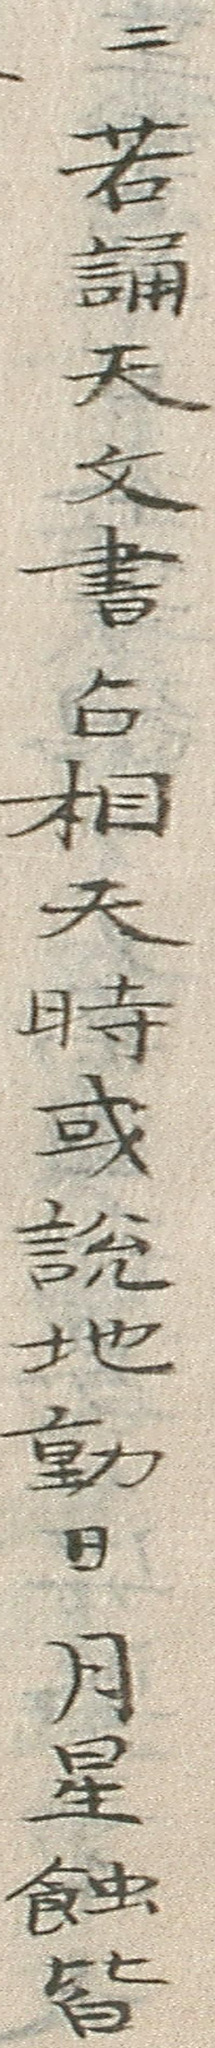ニ若誦天文書ゟ相天時或説地動日月星蝕皆
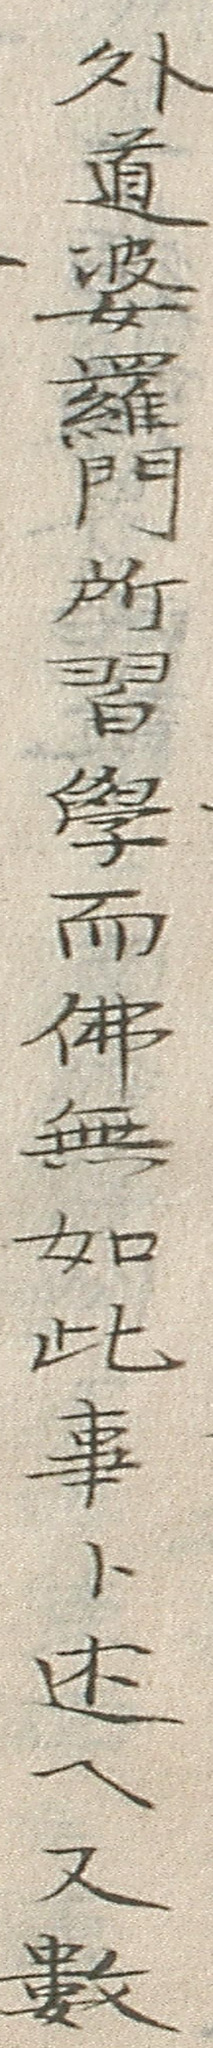外道婆羅門所習学而仏無如此事述ヘ又数
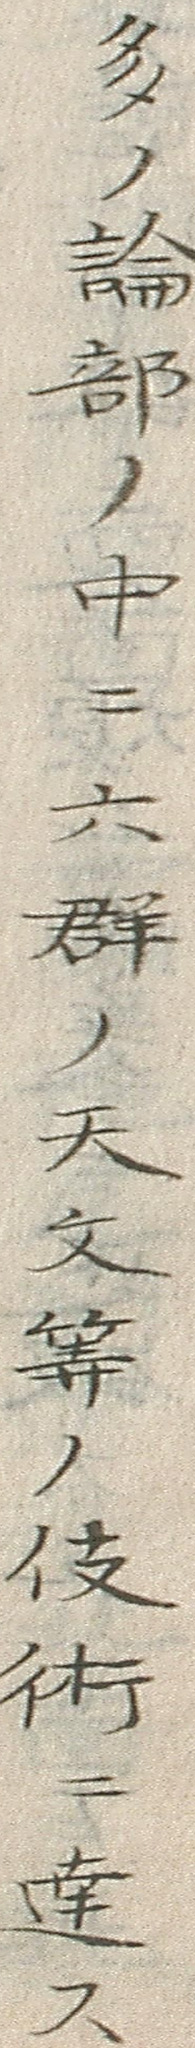多ノ論部ノ中ニ六群ノ天文等ノ技術ニ達ス
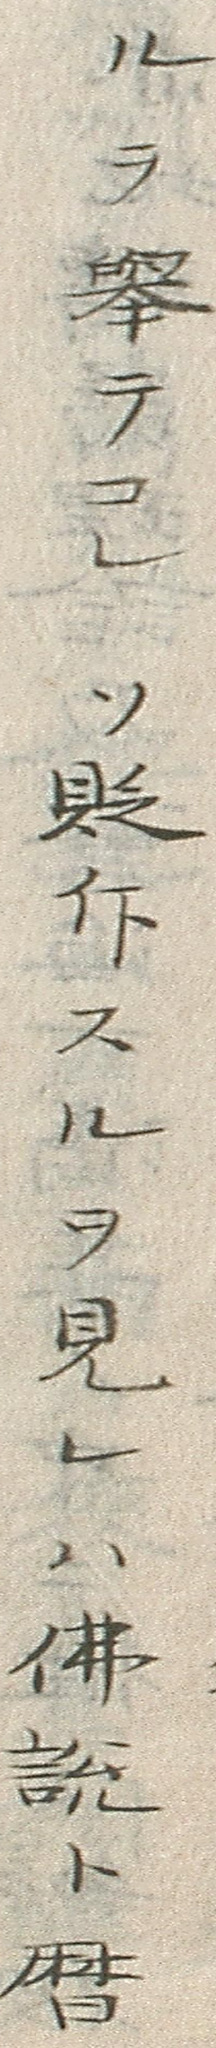ルヲ挙テコレソ貶作スルヲ見レハ仏説ト暦
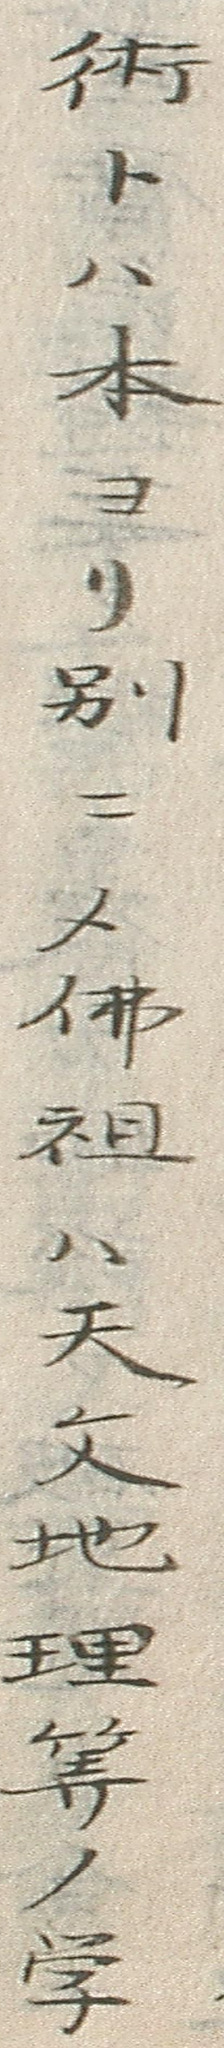術トハ本ヨリ別ニシテ仏祖ハ天文地理等ノ学
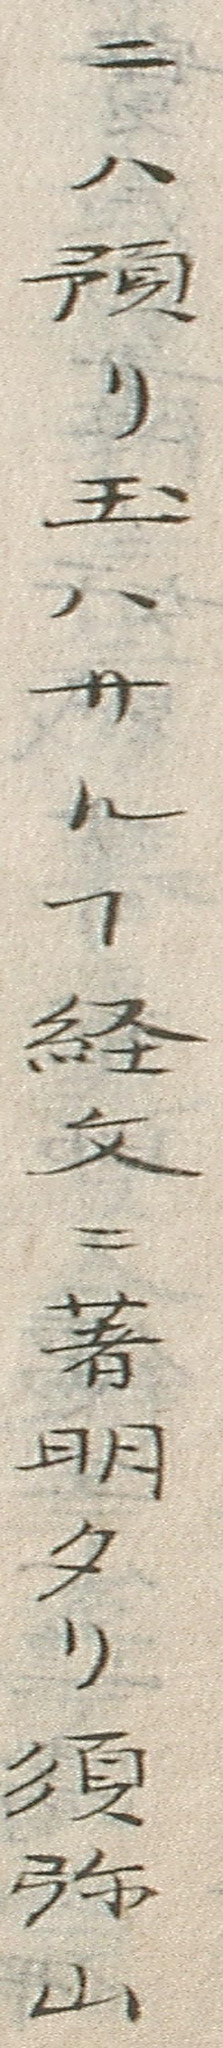ニハ預リ玉ハサルコト経文ニ著明タリ須弥山
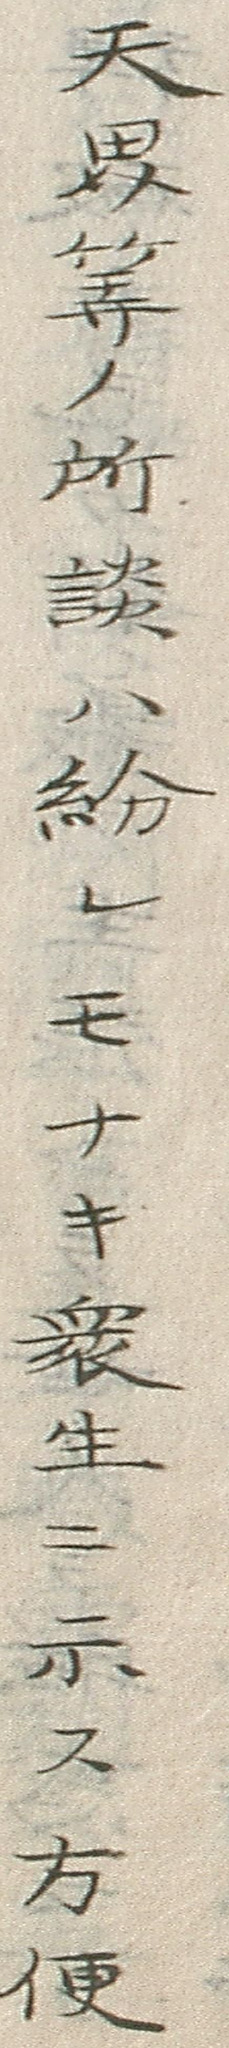天界等ノ所談ハ紛レモナキ衆生ニ示ス方便
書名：天學略名目羽翼　全
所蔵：東京大学地震研究所図書室 Earthquake Research Institute Library, The University of Tokyo, JAPAN
